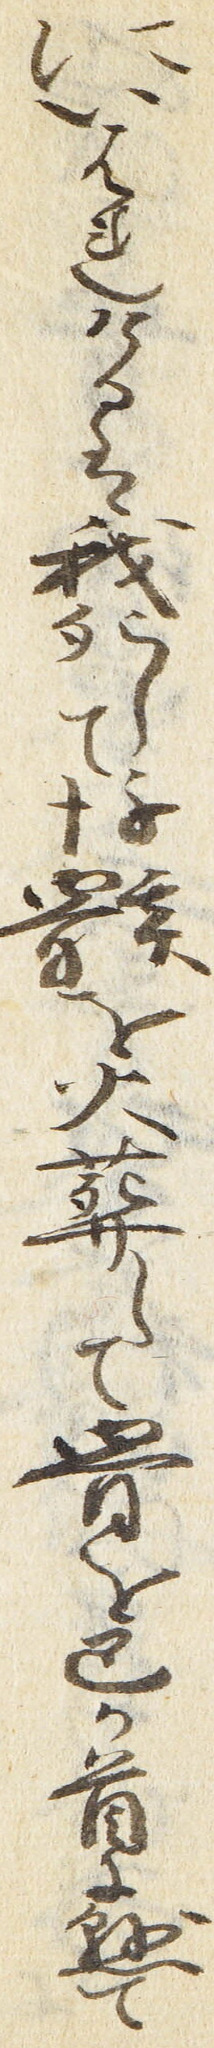にいはれけるは我死して後骸を火葬して骨を己か首に懸て
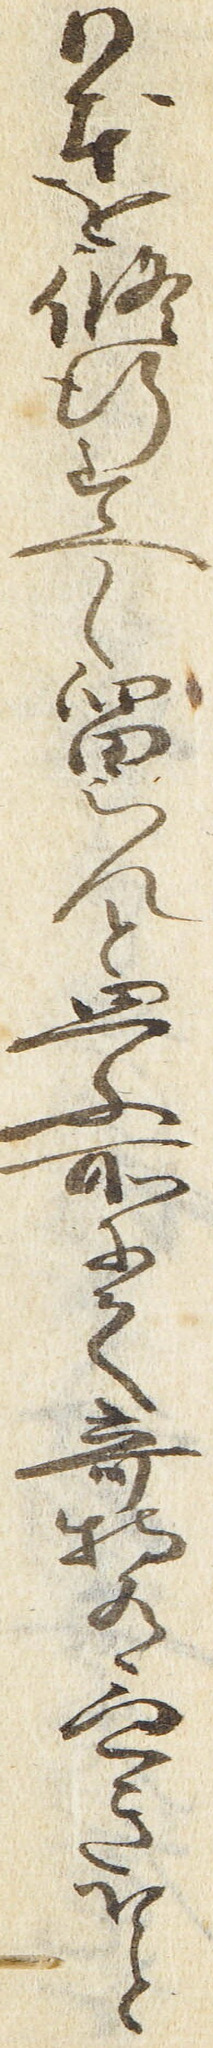日本を修行すへし留らんと思ふ所にて奇特有へきそと
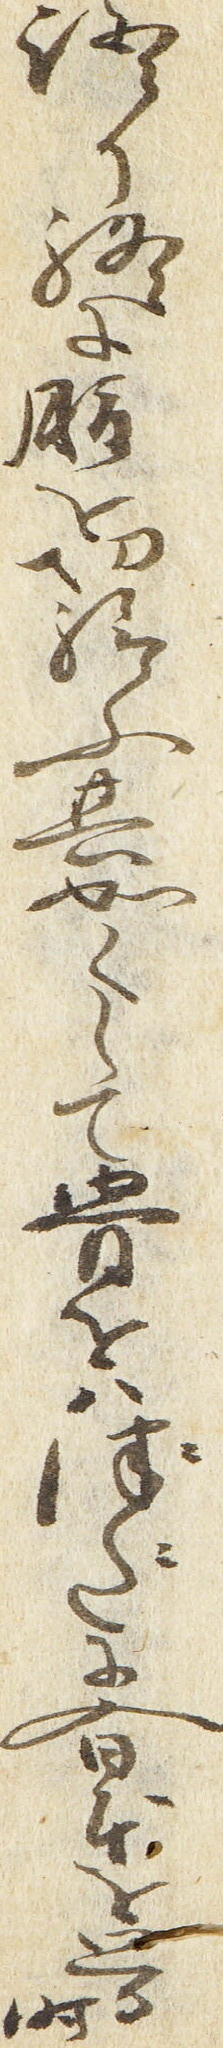語り終に腹を切給ふ其如くして骨をはづだに入日本を廻る時

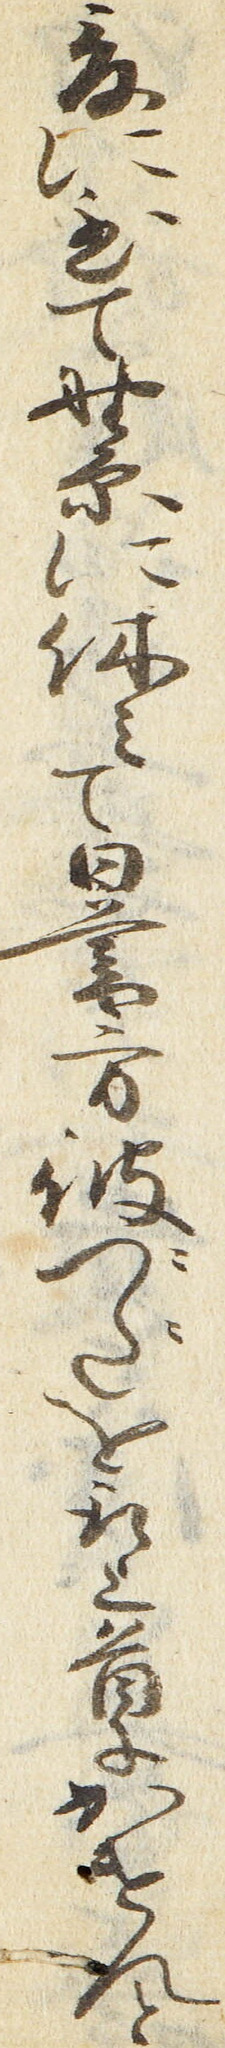爰に至て野原に休みて日暮方彼づだを取上首にかけんと
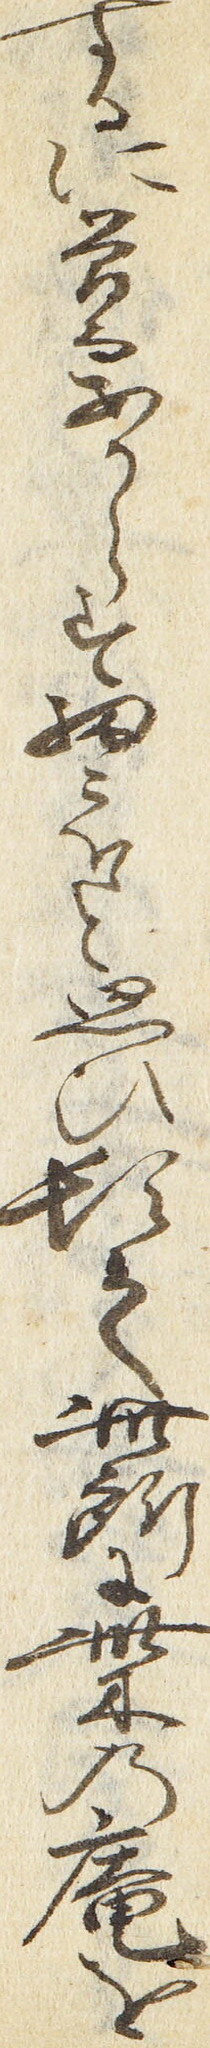するに曽而あからす扨こそと思ひ頓て此所に柴の庵を
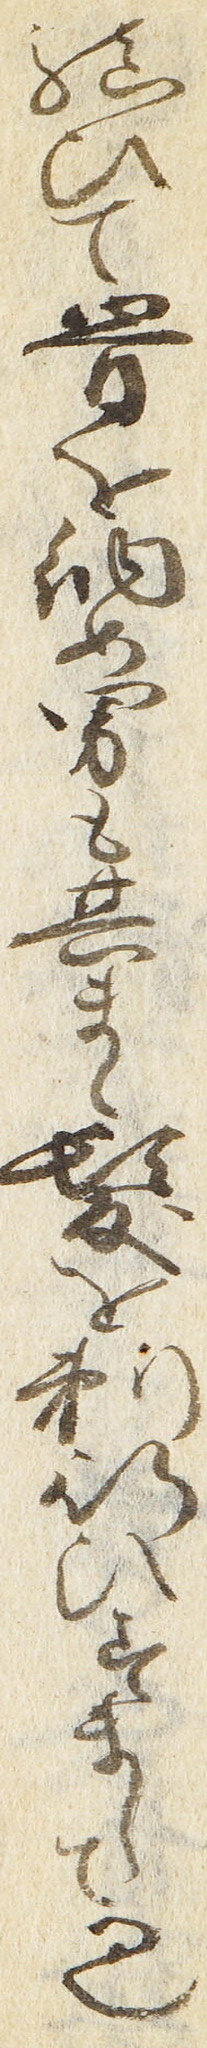結ひて骨を納め男も其まゝ髪を剃行ひすまして過
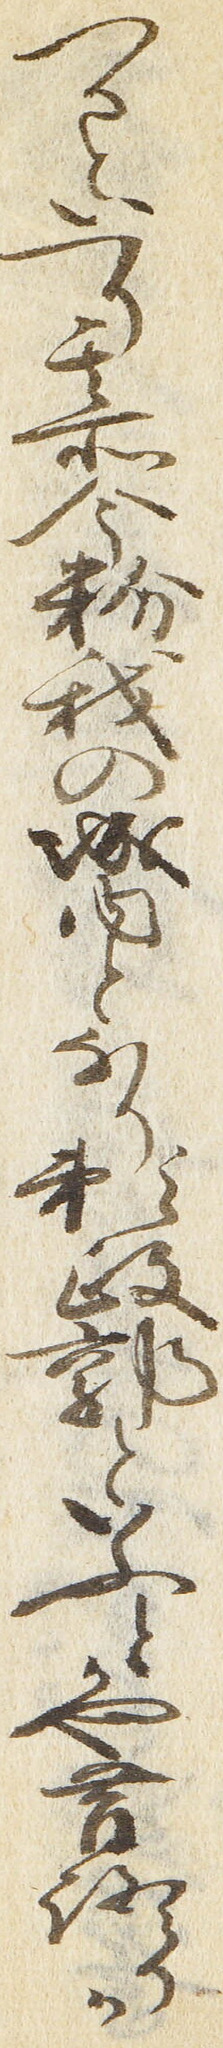つるといへり其所今粉我の城内となり頼政郭といふとかや昔語りか
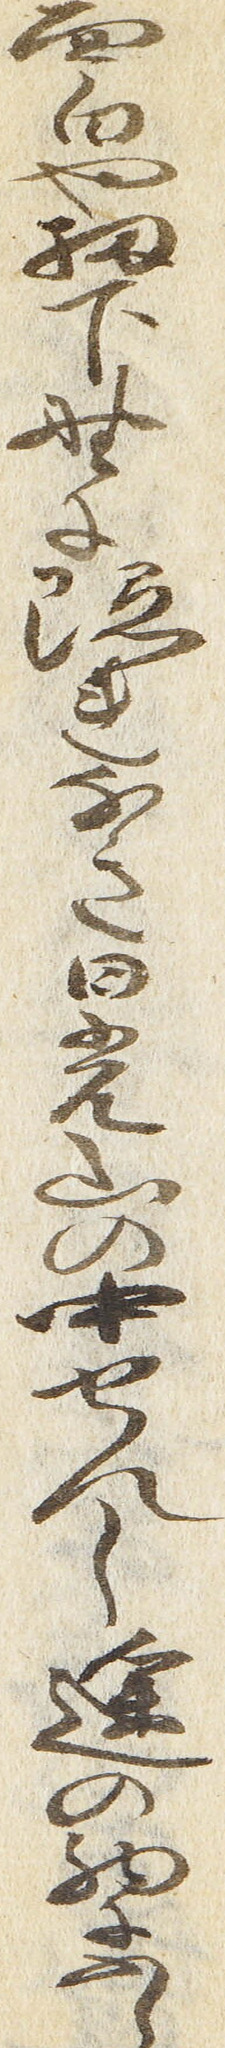面白や扨下野に隠れなき日光山の中せんし途の西にふし
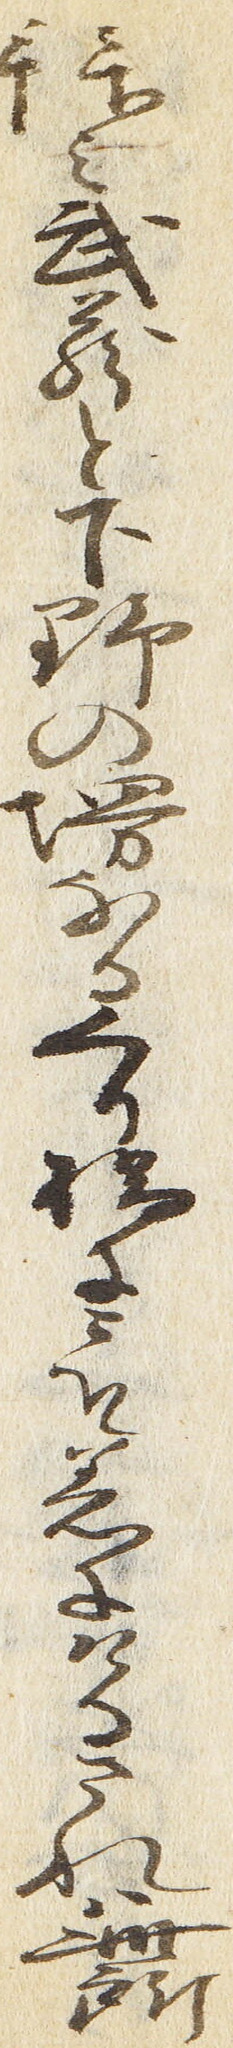拝み武蔵と下野の堺なるくり橋にこそ着にけるされは此所
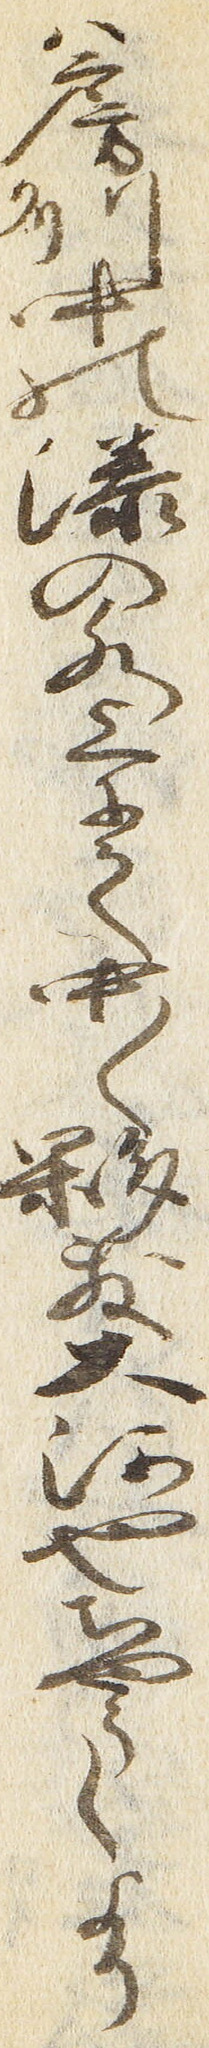は房州中の湊の水上にて中〳〵夥敷大河也ちやうしより
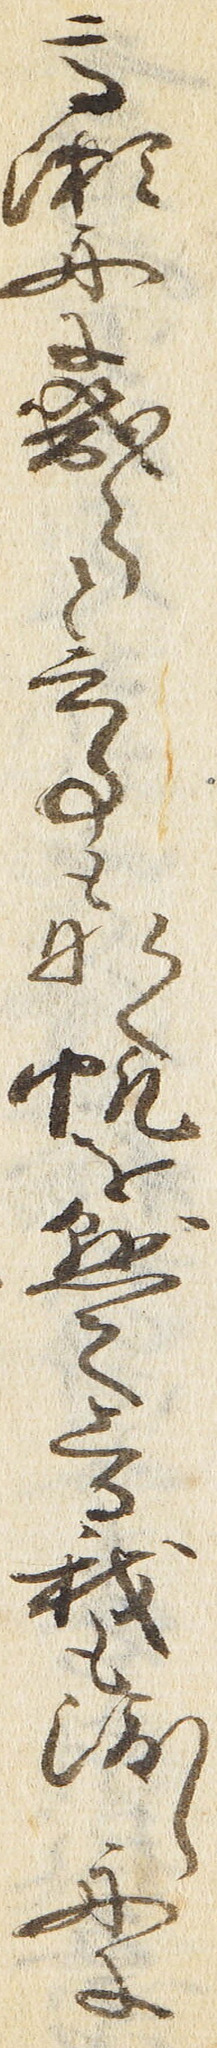高瀬舟に幾らと云事もなく帆を懸て上る我も渡し舟に
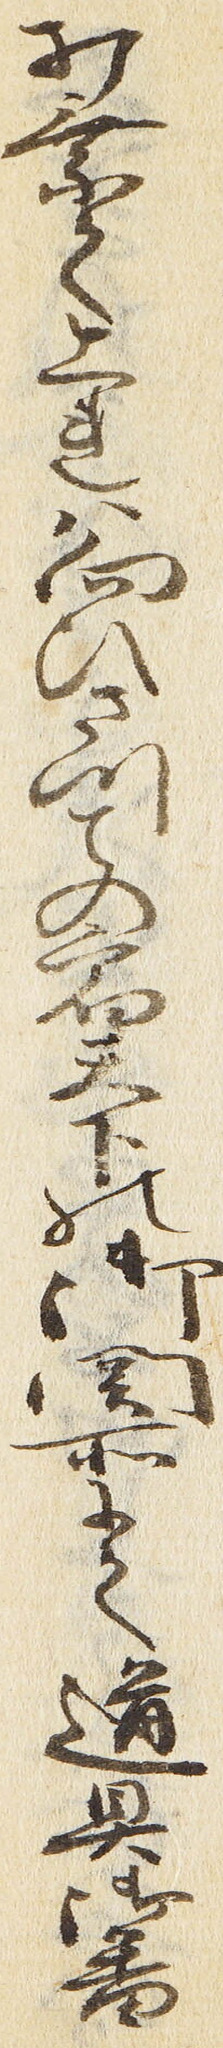打乗て上れは向ひさつての宿天下の御関所にて道具御番
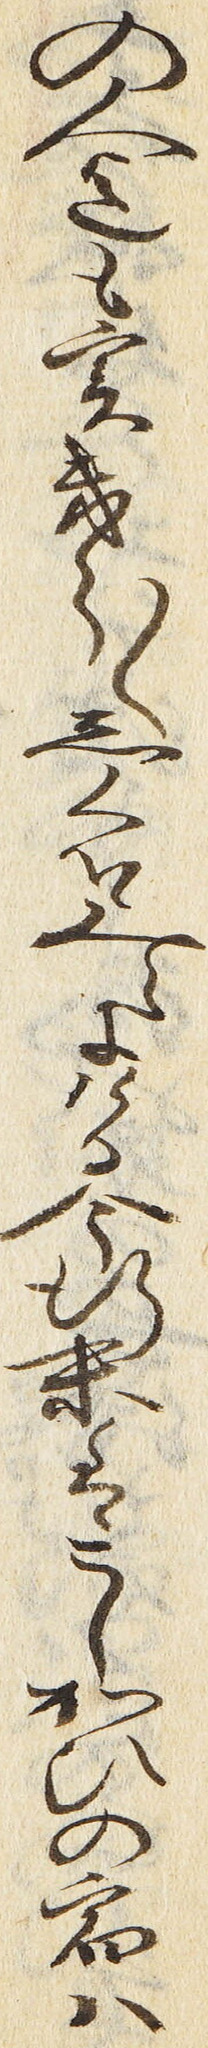の人迄も実きら〳〵しくそみえにける今行末はこしかひの宿は
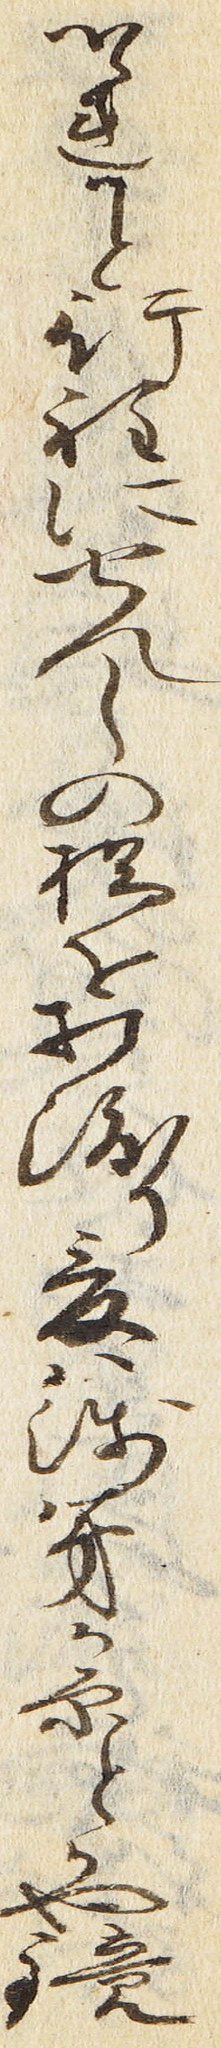それかと行程にせんしの橋を打渡り爰は浅茅か原とかや鏡
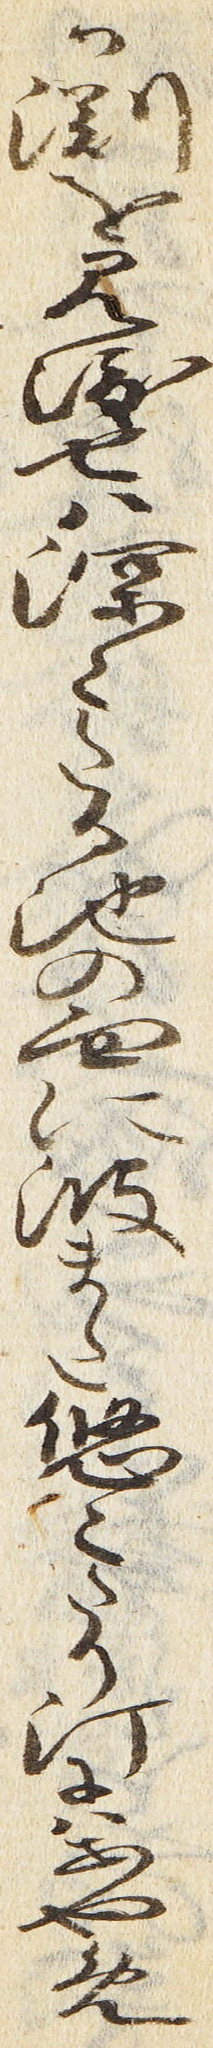か渕を見渡せは深々たる池の面に波また悠々たり汀にはあやめ
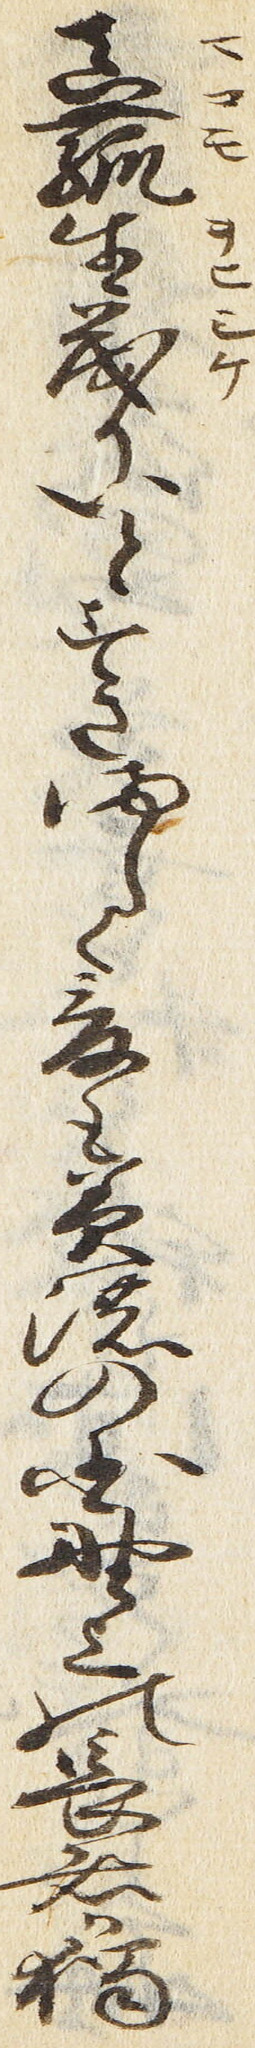真菰生茂りいとすさましく爰も美濃の国野上の長者か独
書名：海陸世話日記
